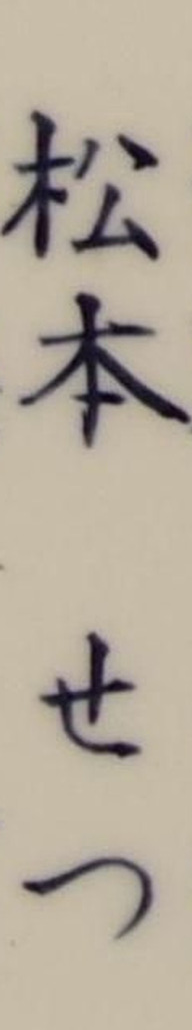松本せつ
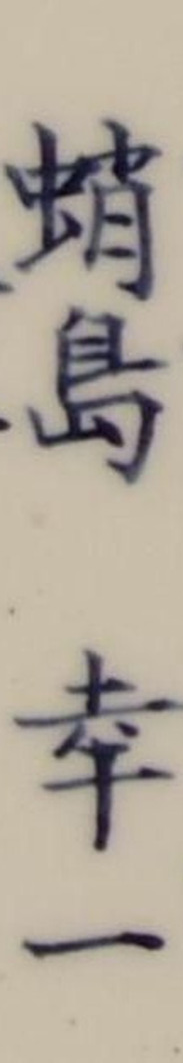蛸島幸一
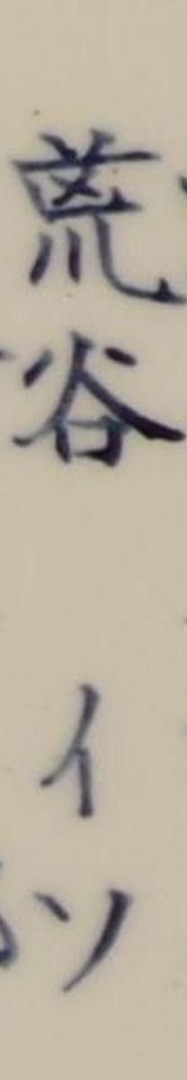荒谷イソ

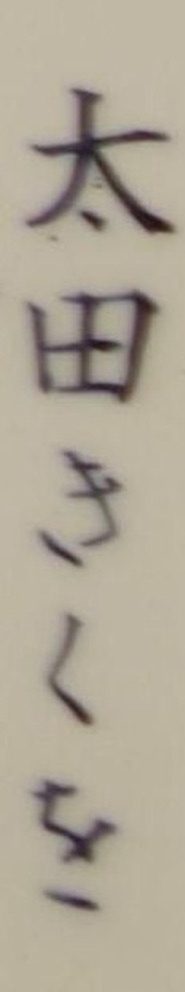太田きくを
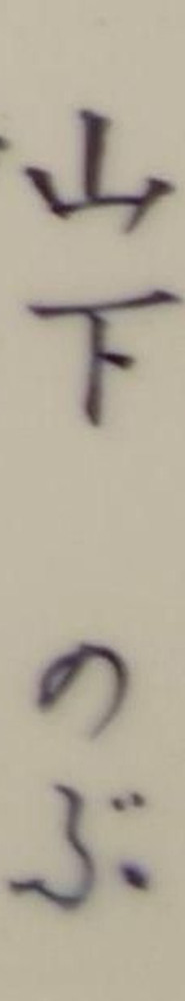山下のぶ
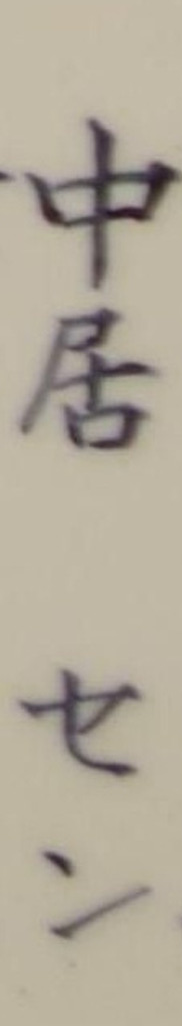中居セン
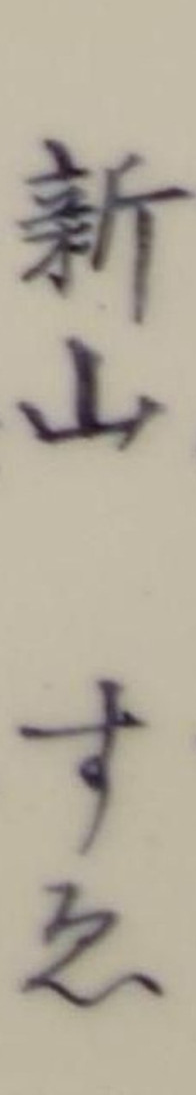新山すゑ
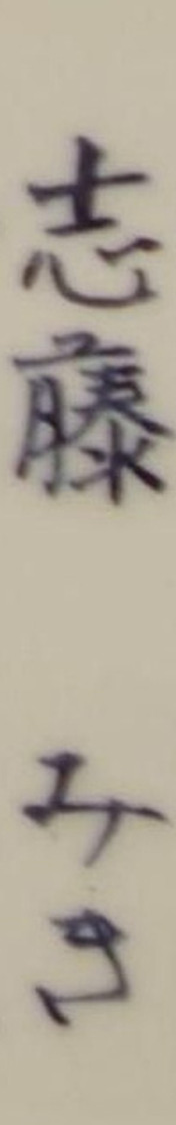志藤みき
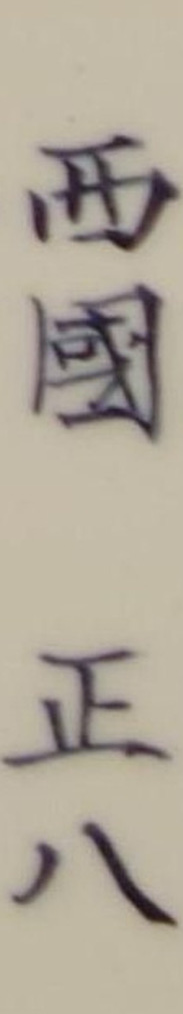西国正八
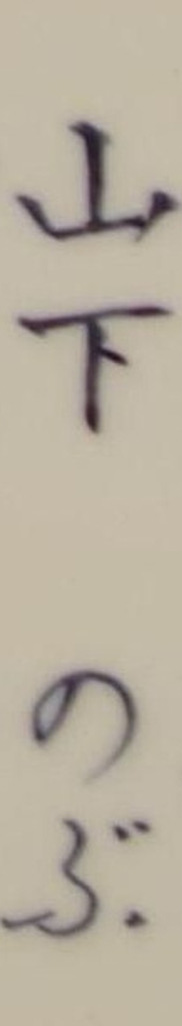山下のぶ
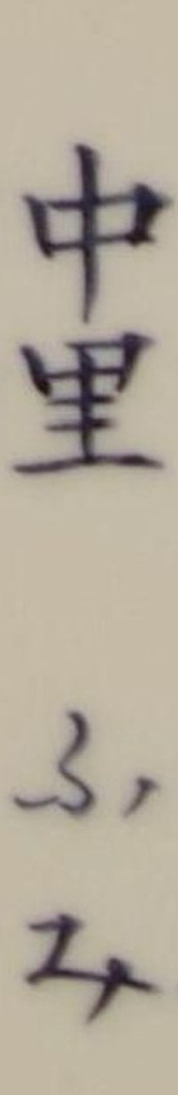中里ふみ
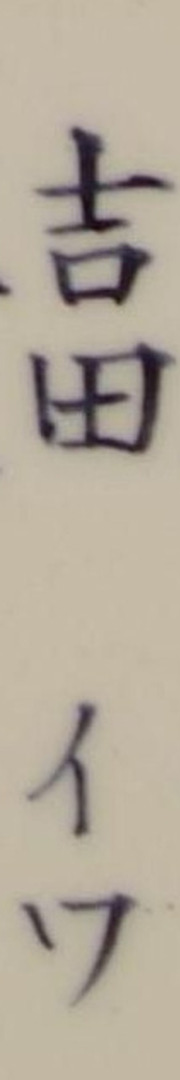吉田イワ
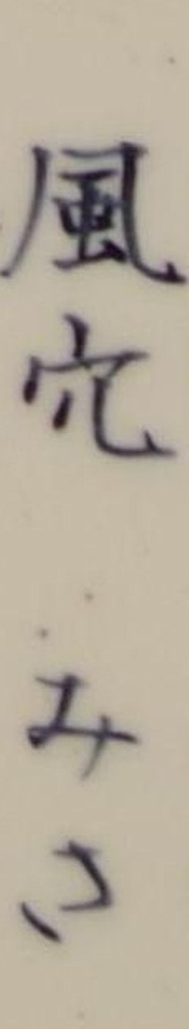風穴みさ
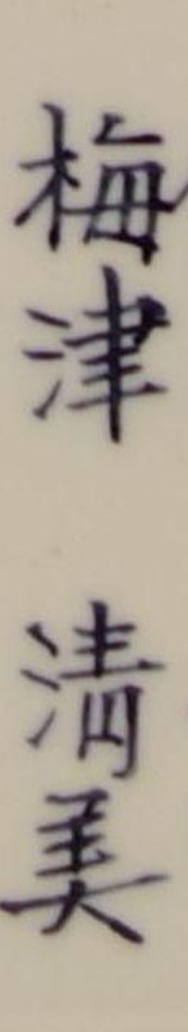梅津清美
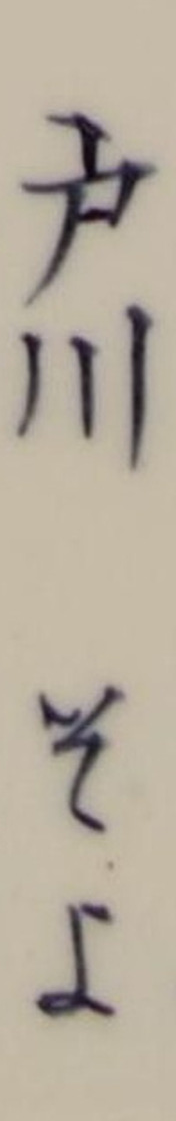戸川そよ
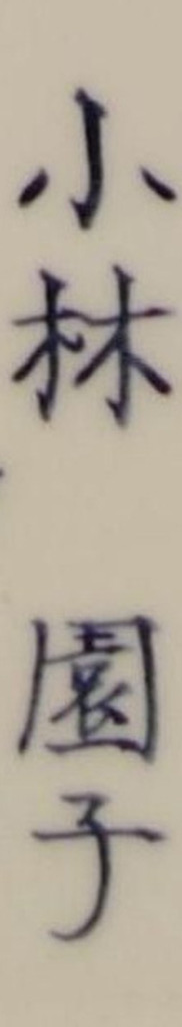小林園子
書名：M~S
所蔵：高野山金剛峯寺
